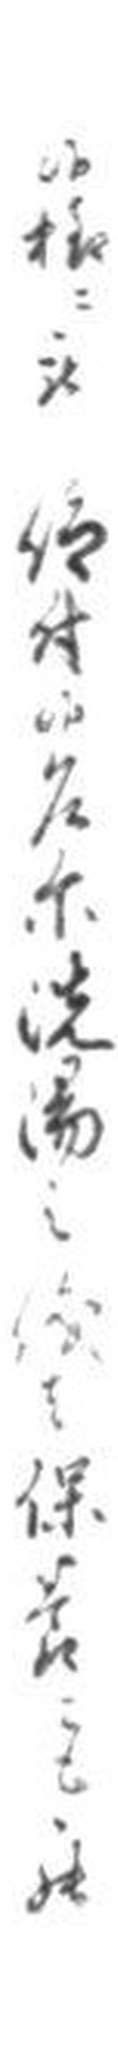候様ニ被仰付候乍尓洗湯之儀者保養ニも罷
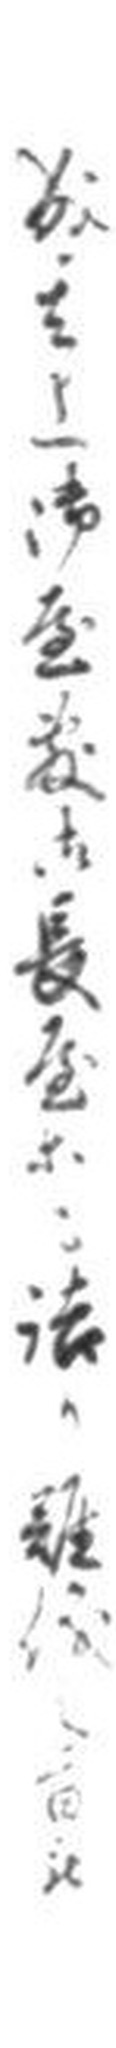成其上御屋敷御長屋等も詰り難儀之旨被
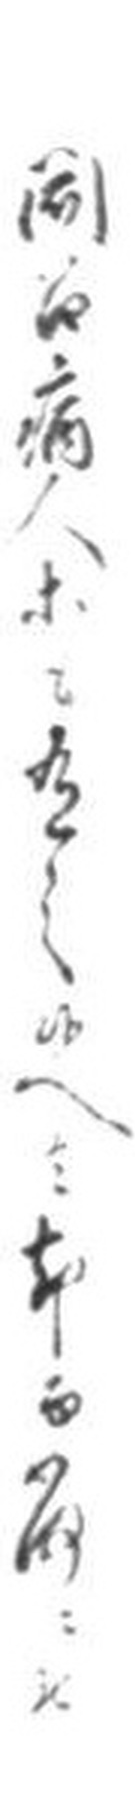聞召病人等も有之候へ者却而如何ニ被
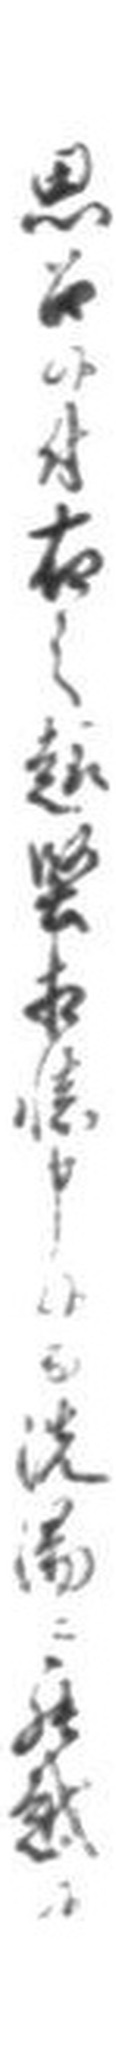思召候付右之趣堅相慎申候而洗湯ニ罷越候
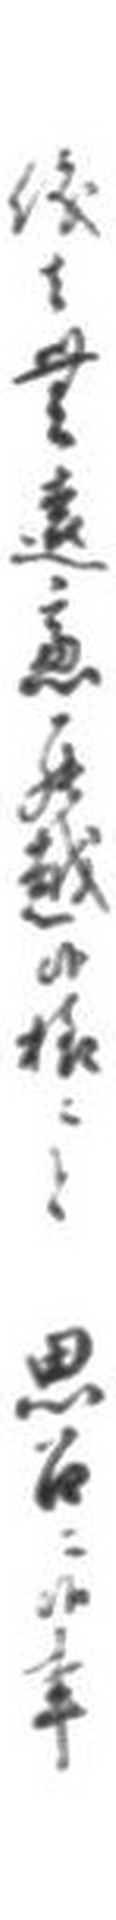儀者無遠慮罷越候様ニと思召ニ候事
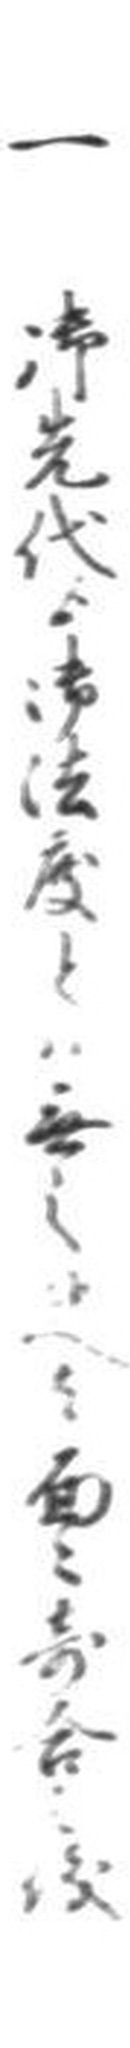一御先代ゟ御法度とハ無之候へ者面々寄合之儀
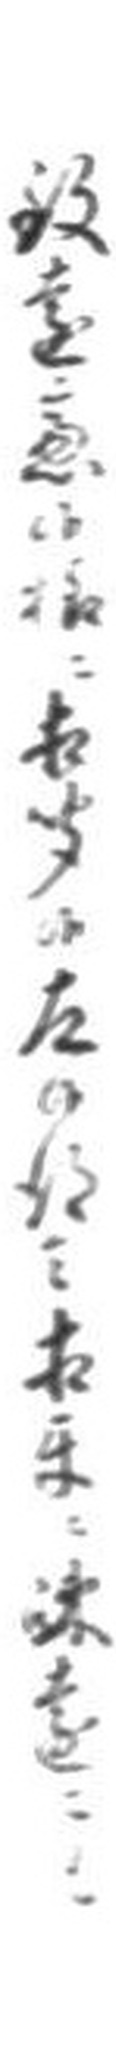致遠慮候様ニ相聞候左候得者相互ニ疎遠ニも
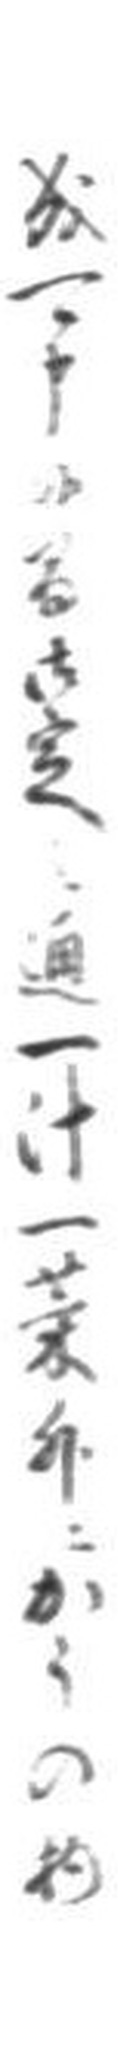成可申候間御定之通一汁一菜外ニかうの物
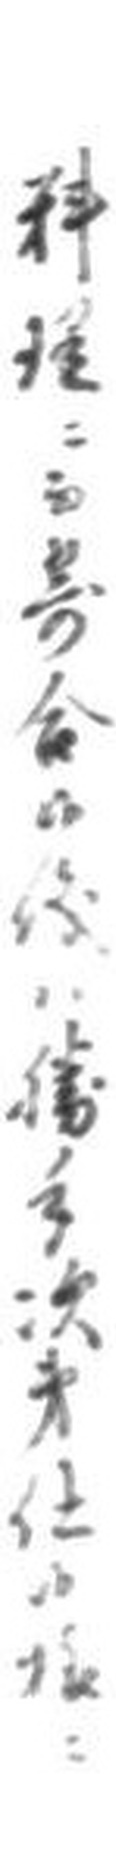料理ニ而寄合候儀勝手次第仕候様ニ
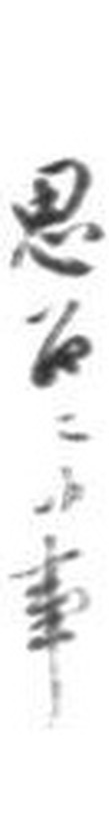思召ニ候事
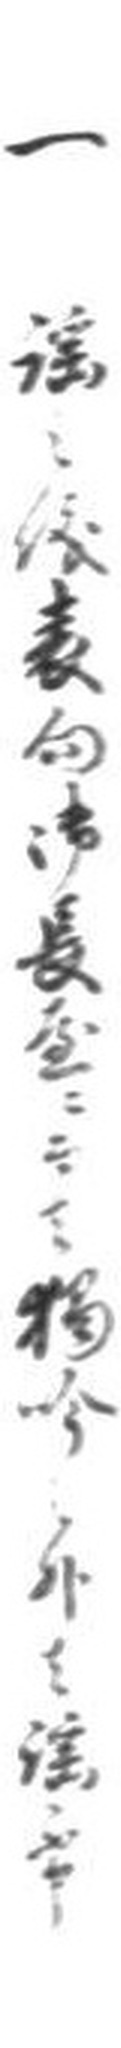一謡之儀表向御長屋ニ而者独吟之外者謡不申
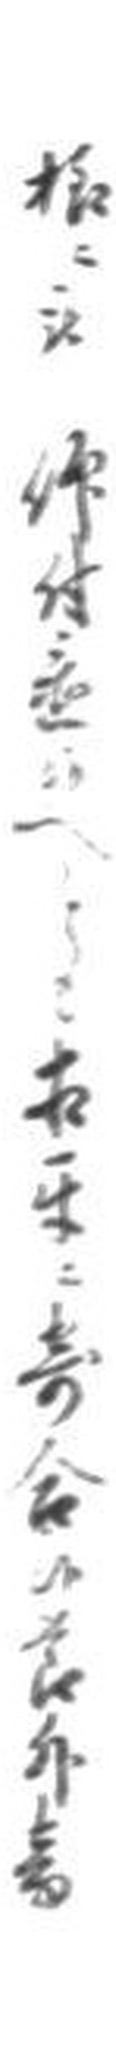様ニ被仰付置候へとも相互ニ寄合候節外音
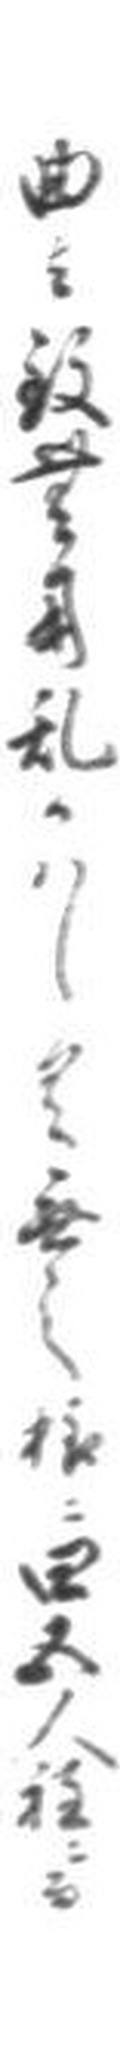曲者致無用乱かハしく無之様ニ四五人程ニ而

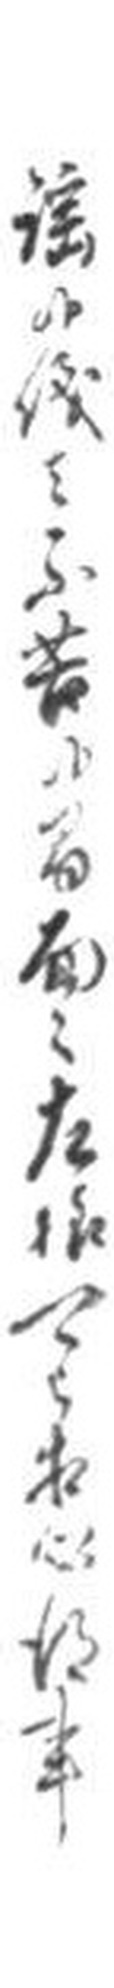謡候儀者不苦候間面々左様可被相心得事
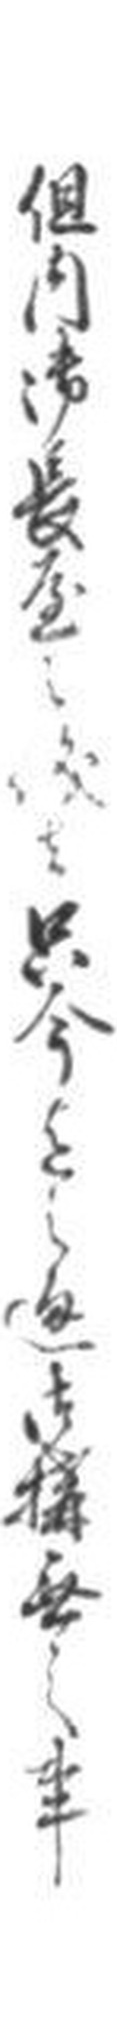但内御長屋之儀者只今迄之通御構無之事
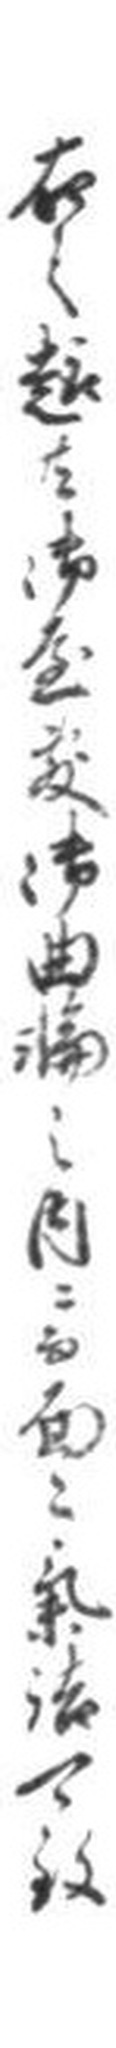右之趣共御屋敷御曲輪之内ニ而面々気詰可致
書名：家譜 三十五 宗昌公 従享保六年到同七年
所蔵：福井県文書館 Fukui Prefectural Archives
